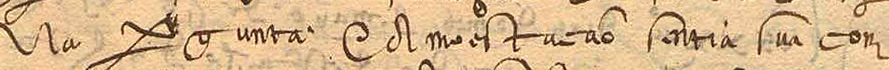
na ꝑgunta e Amoestaçaõ sentia sua com
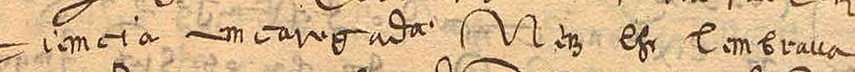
Ciemcia emcaregada nem lhe lembraua
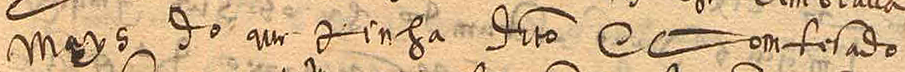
mays do que tinha dīto e Comfesado
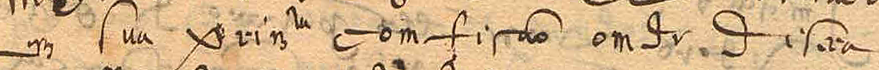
em sua primra comfisão omde disera
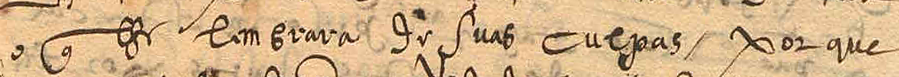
o q̄ lhe lembraua de suas culpas porque
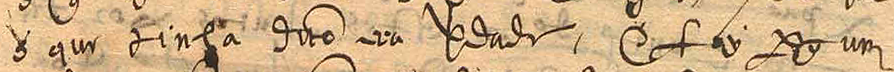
o que tinha dīto era ꝟdade, e foy ꝑgum
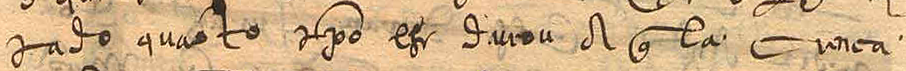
tado quāto tp̄o lhe durou Aq̄la crença
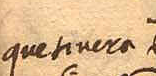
que tiuera
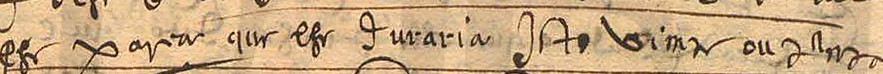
lhe parece que lhe duraria Jsto vimte ou trinta
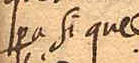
ꝑa si que
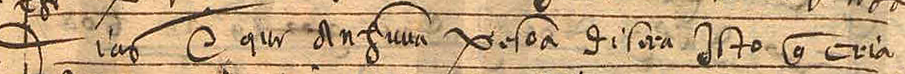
dias e que A nhūua pesoa disera Jsto q̄ cria
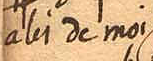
a lei de moi
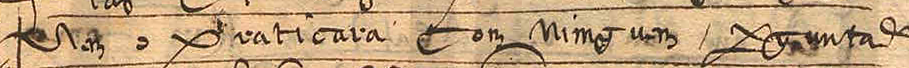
Nem o praticara com nimguem / ꝑguntado
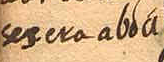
ses era a boa
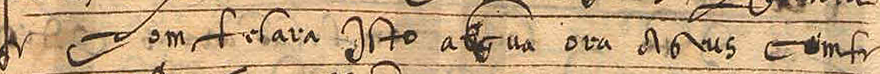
se comfesara Jsto alḡua ora A seus comfe
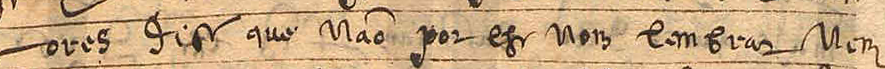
sores dise que não por lhe nom lembrar nem
